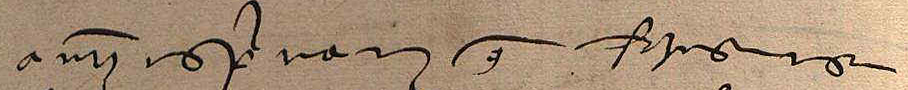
a mj̄ esp̄vam q̄ fizese este
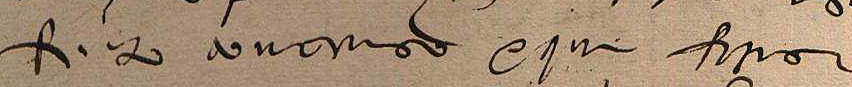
feito concruso e que fizese
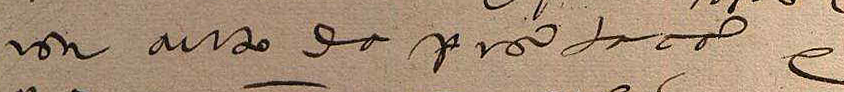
este auto dapesētaçā e
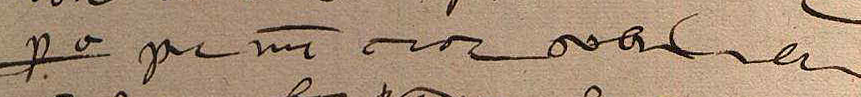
ꝑa pernūciar sobre ele
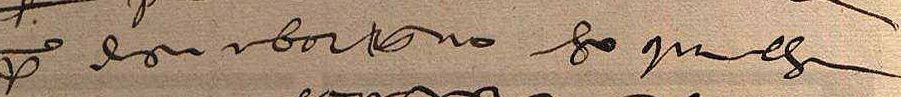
p̄o desenbarguo ho que lhe
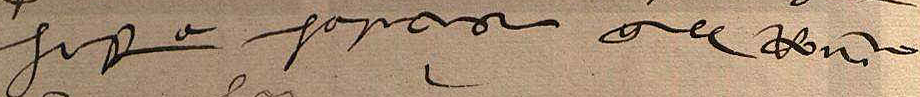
Justa parecese gill Romro
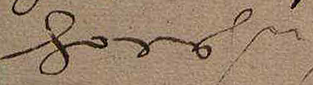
ho espui
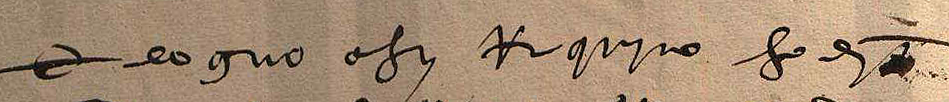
E loguo ahy Requereo ho djto
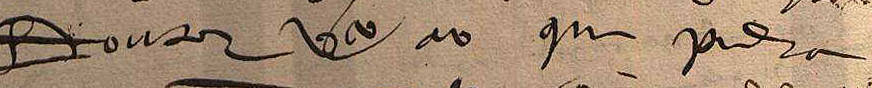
Doutor vco ao que pedia
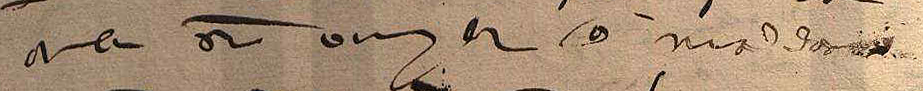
a ele s̄r ouujdor q̄ mādase
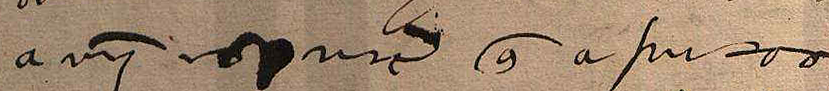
a mj̄ espriuā q̄ aJuntase
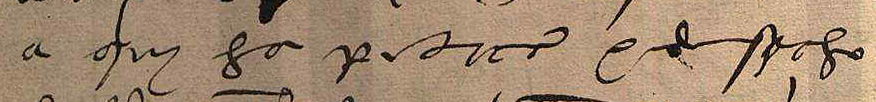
aquj ha petiçā e despacho
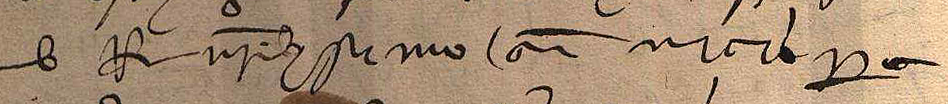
do Reurēdysimo s̄or nucio ꝑa
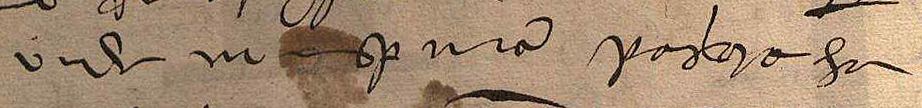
onde eu espriuā pasara ha
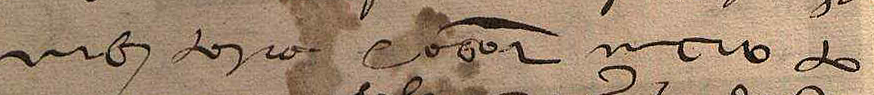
enibjtoria e o s̄or nucio to
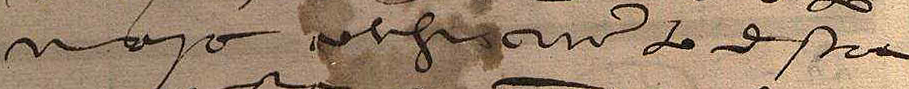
mara conhecimēto desta
